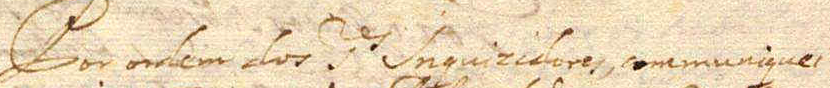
Por ordem dos s.res Inquizidores communiquei
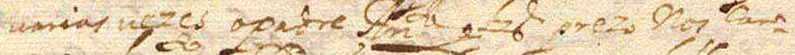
uarias uezes o padre Anto glz̄ prezo Nos car
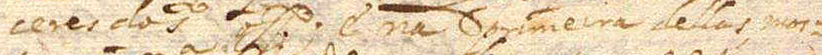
ceres do s off.o; e na primeira dellas mos
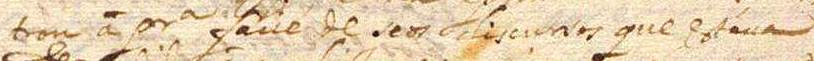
trou a pra facie de seos discursos que estaua
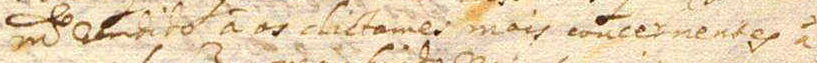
mto Rendido aos dictames mais concernentes á
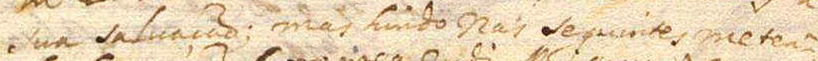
sua saluação; mas hindo nas seguintes meten
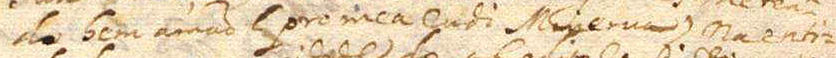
do bem a maõ (pro mea audi Minerua) na enti
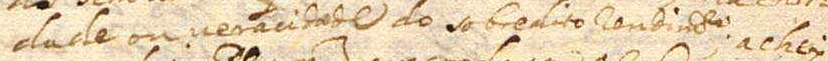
dade ou ueracidade do sobredito Rendimto; achey
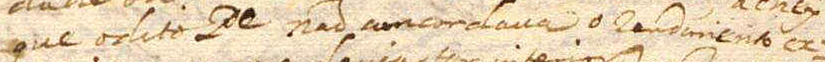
que o dito Pe naõ concordaua o Rendimento ex
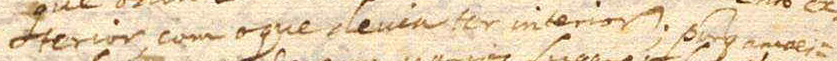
terior com o que deuia ter interior; porq̄ amoes
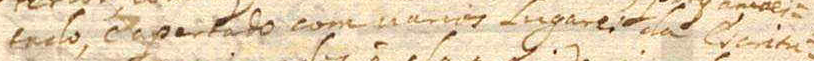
tado, e apertado com uarios Lugares da escritu
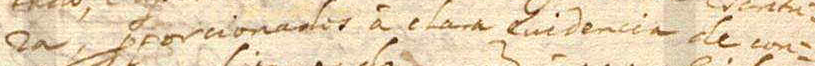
ra, ꝓporcionados á clara euidencia de con
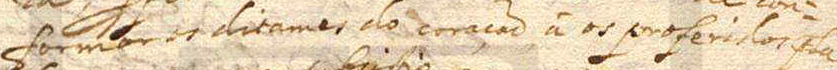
formar os ditames do coraçaõ áos proferidos pla
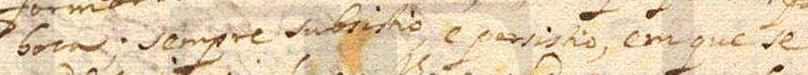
hora; sempre subsistio, e persistio, em que se
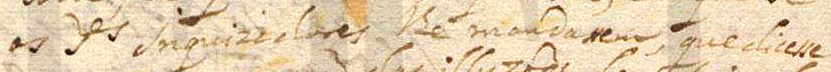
os s.res Inquizidores lhe mandassem que dicesse
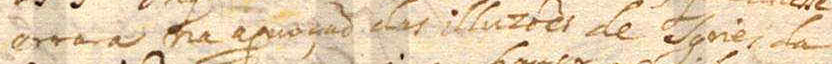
errara na aꝓuaçaõ das illuzoẽs de Ignes da
